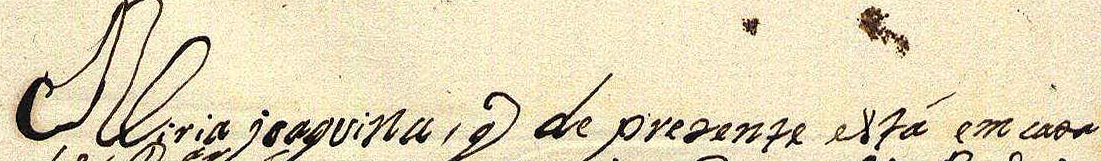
Miria joaquina, q̄ de prezente está em caza
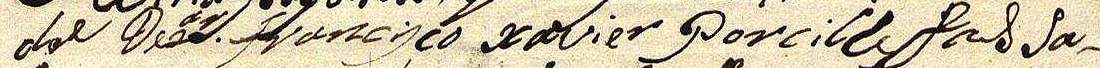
do Dez.or francisco xavier Porcilhe fas sa
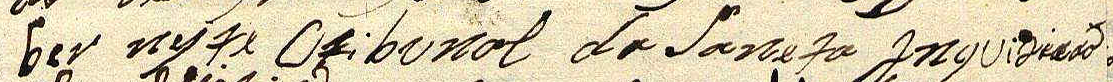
ber neste Otibunal da Sancta Jnquizicaõ
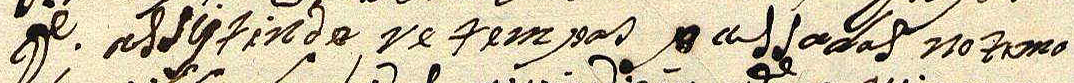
q̄ assistindo re tempos passados no trmo
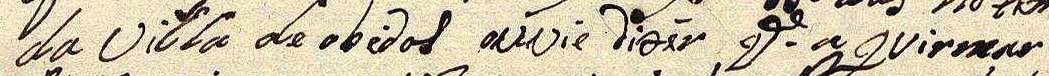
da villa de obidos ouvie dizer q̄. a gvirmar
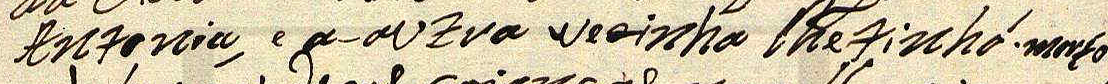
Antonia, e a-outra vezinha lhe tinhó morto
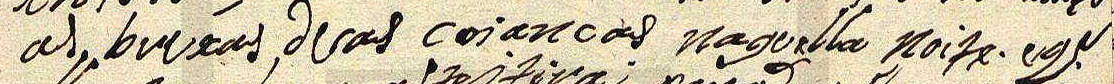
as, bruxas duas crianças naquella noite. e q̄
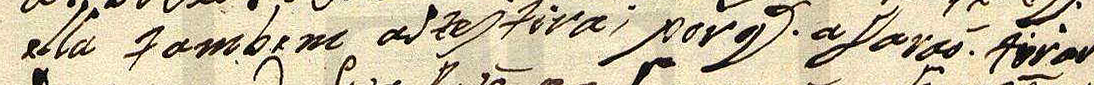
ella tambem as tejtira; porq̄. a foraõ. tirar
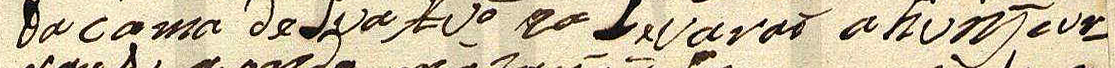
da cama de Sua Avó e a Levaraõ a huns̄ cur
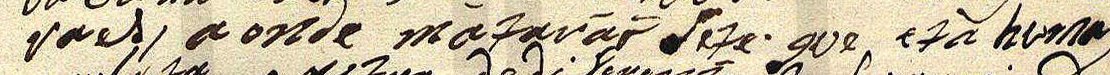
raes, aonde matarão sete. que, eta huma
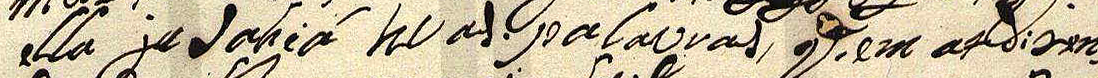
ella ja sahia huas. palavras, q̄ em az dizen
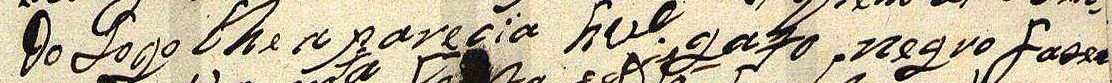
do Logo lhe aparecia hū gato negro faze
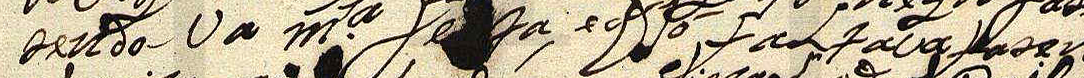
zendo va m.ta fe_ta, e q̄ so, faLtaua faser
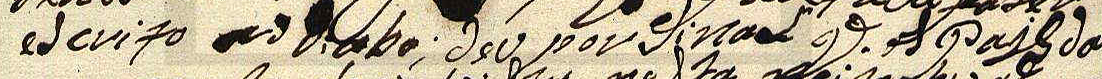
escrito ao Diabo; deu por sinal q̄ os pais da
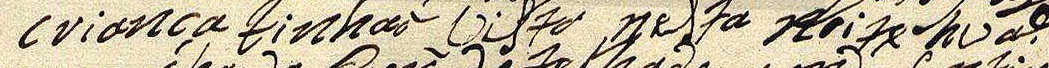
criança tinhaõ visto nesta noite huā.
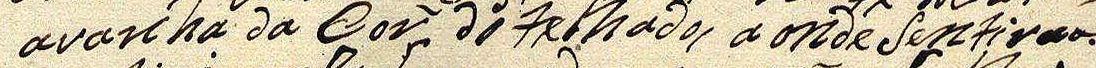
aranha da Cor do telhado, aonde sentiraõ.
